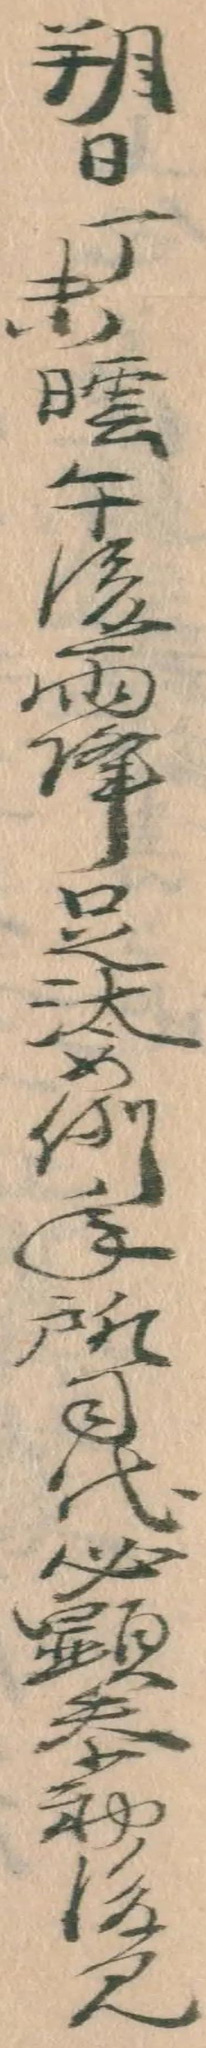朔日丁未晴午後雨降足汰如例年折司代必顕参勤後見
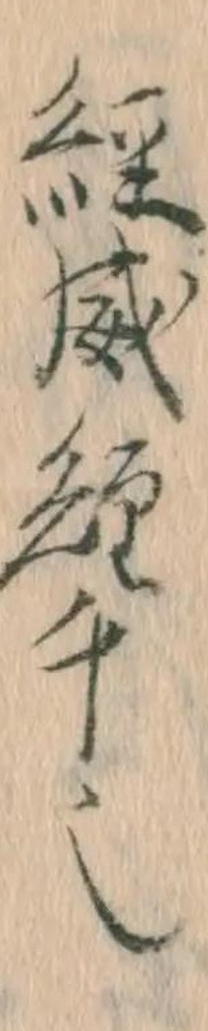経威経千也
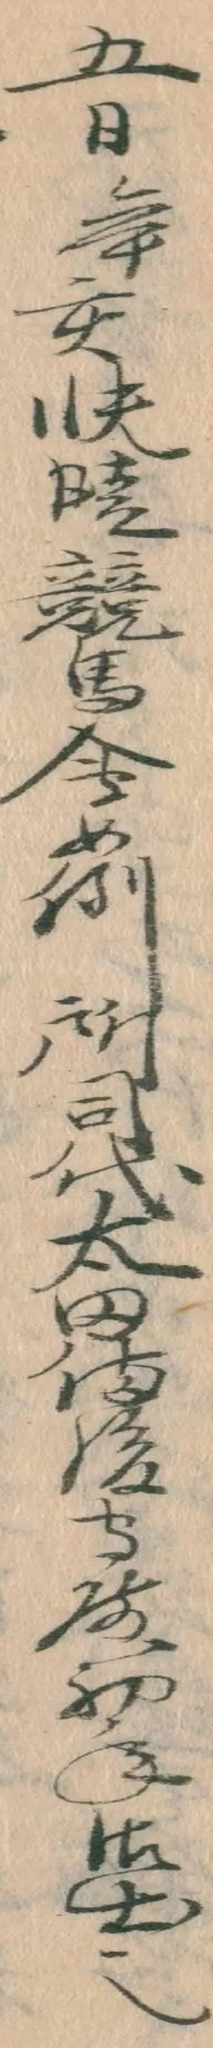五日辛亥快晴競馬會如例所司代太田備後守殿初年御出也
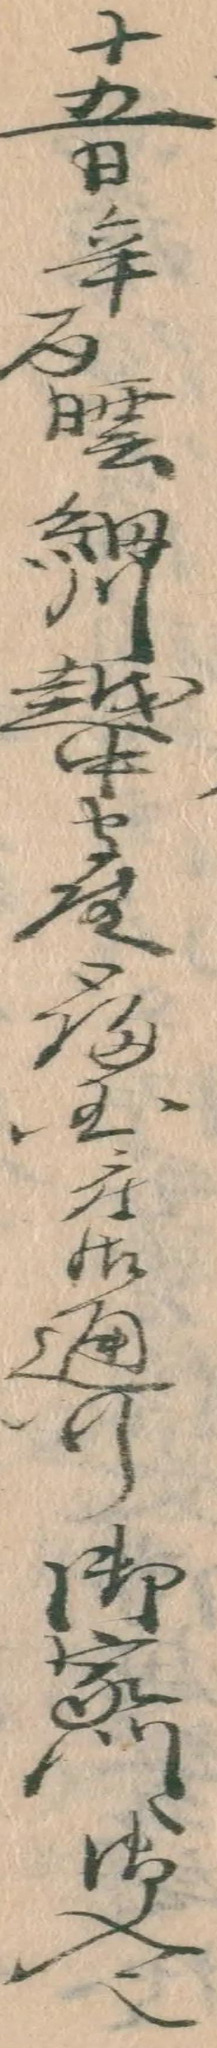十五日辛酉曇細川越中守殿御帰国ニ付御通行御家門へ御入也
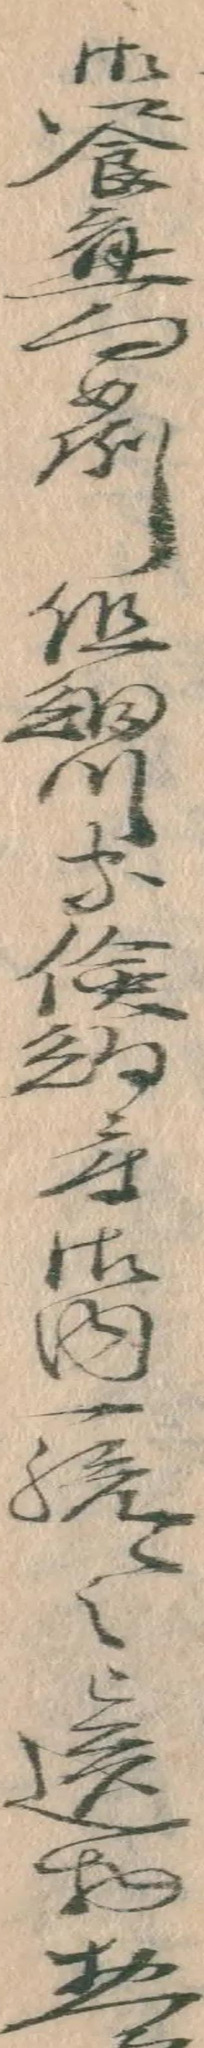御饗應向如例但細川家倹約ニ付御内一統へ之被送物惣而
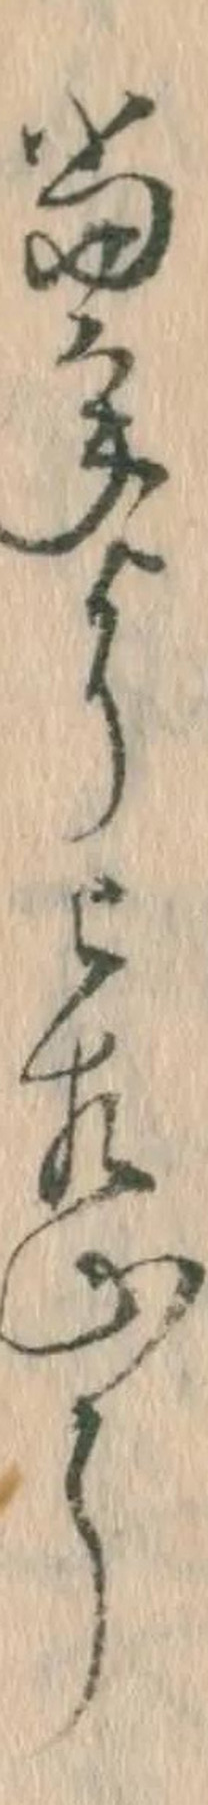當年より被相止了
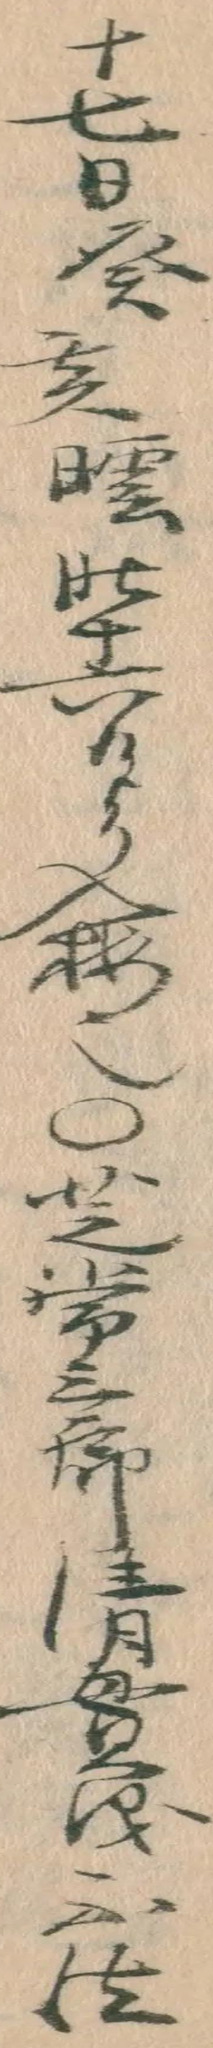十七日癸亥曇昨十六日より入梅也○芝常三郎清貫義不法
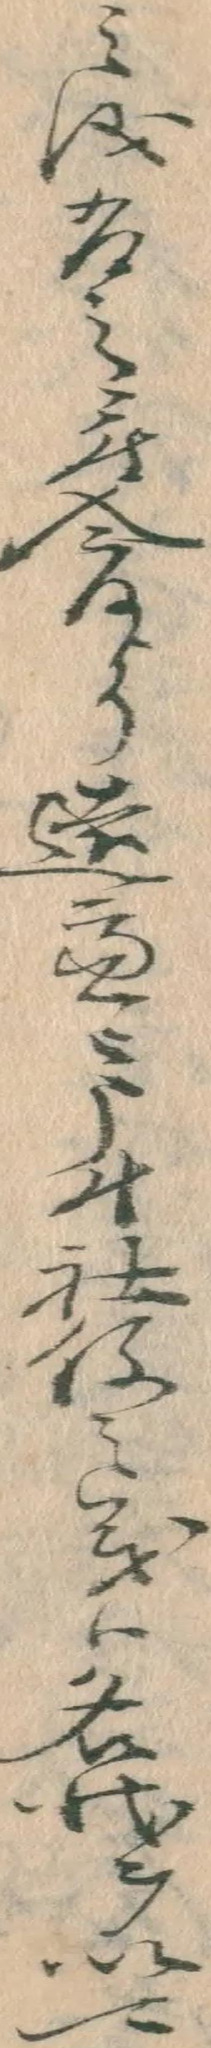之儀有之ニ付今日より遠慮被申付社役之義は名代ヲ以可
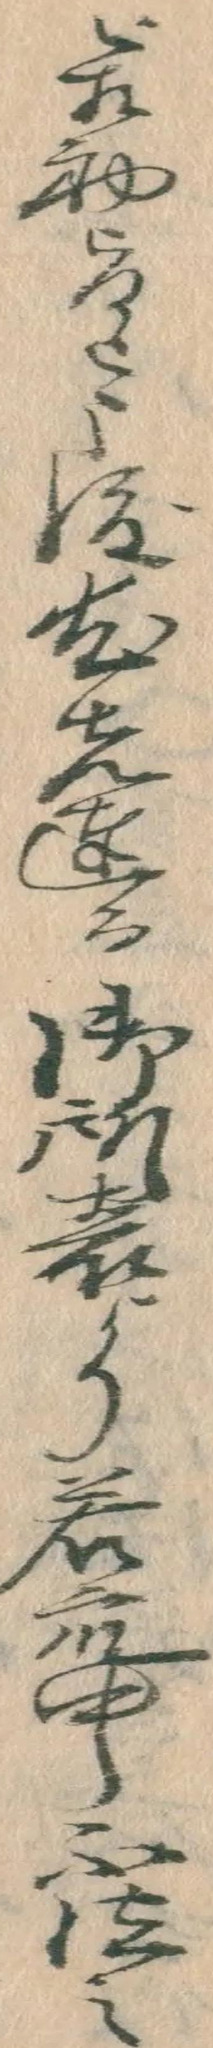被相勤旨被申渡尤先達而御所表より若衆中不法之
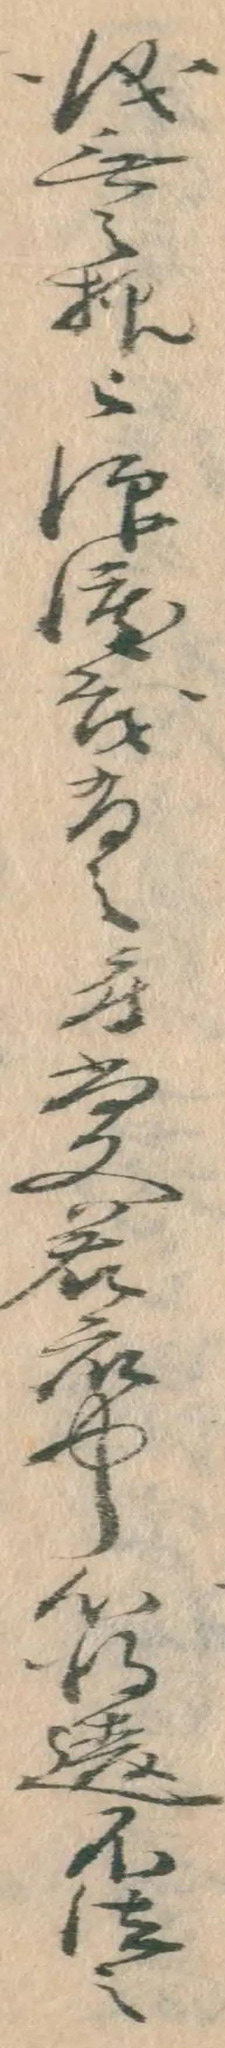儀無之様被仰渡も有之ニ付尚又若衆中心得違不法之
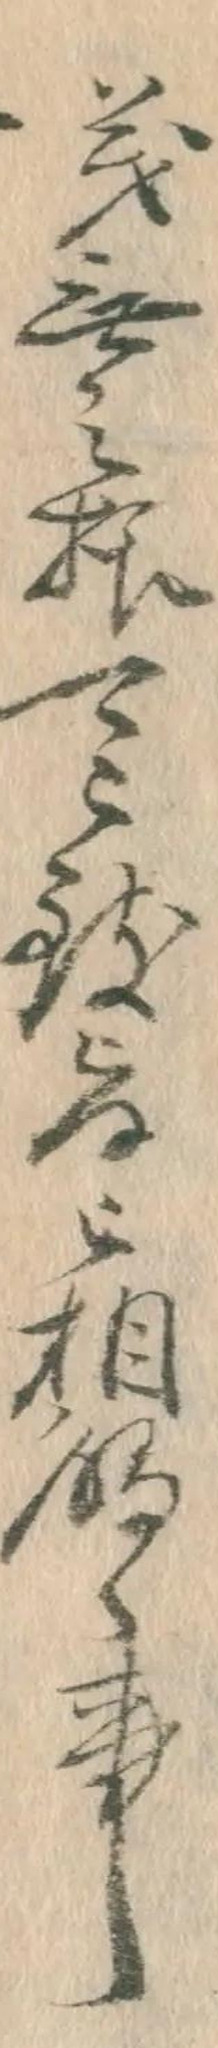義無之様可被致旨被相触候事
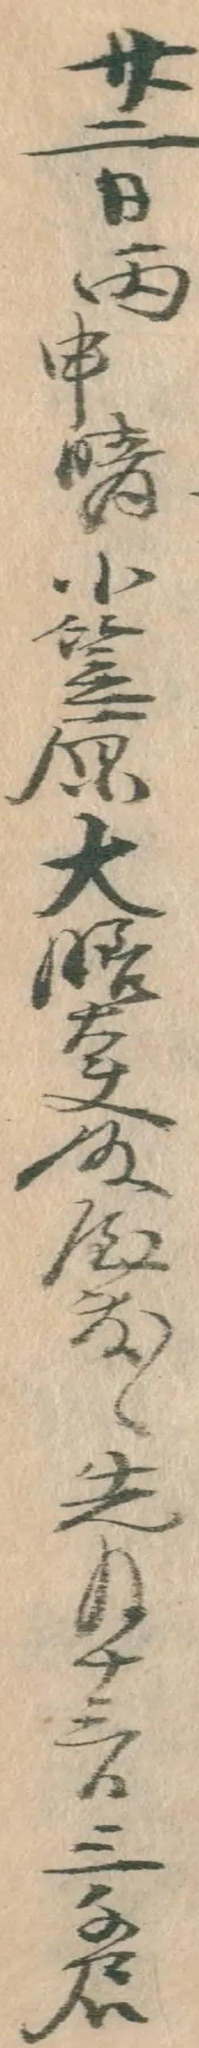廿二日丙申晴小笠原大膳大夫殿屋敷へ先月十三日三千石

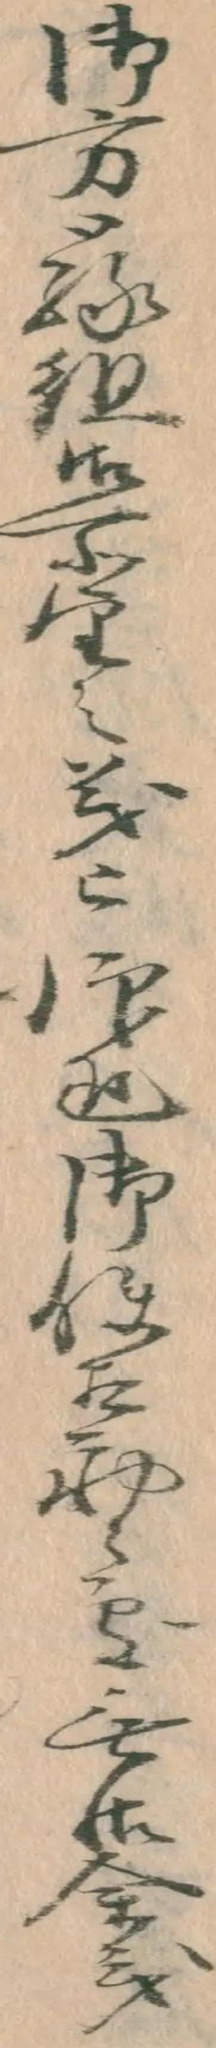御方御縁組御所望之義被仰出御使相勤候處無御余義
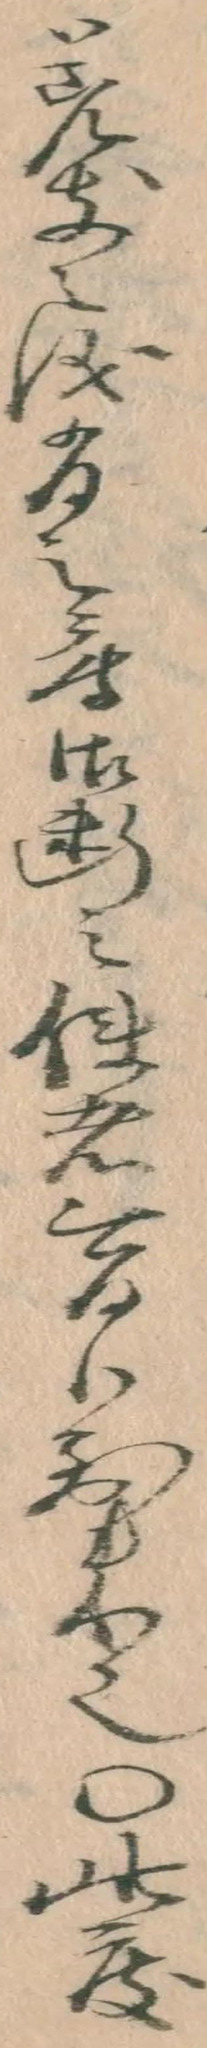御差支之儀有之ニ付御断之使者今日ハ到来也〇此度
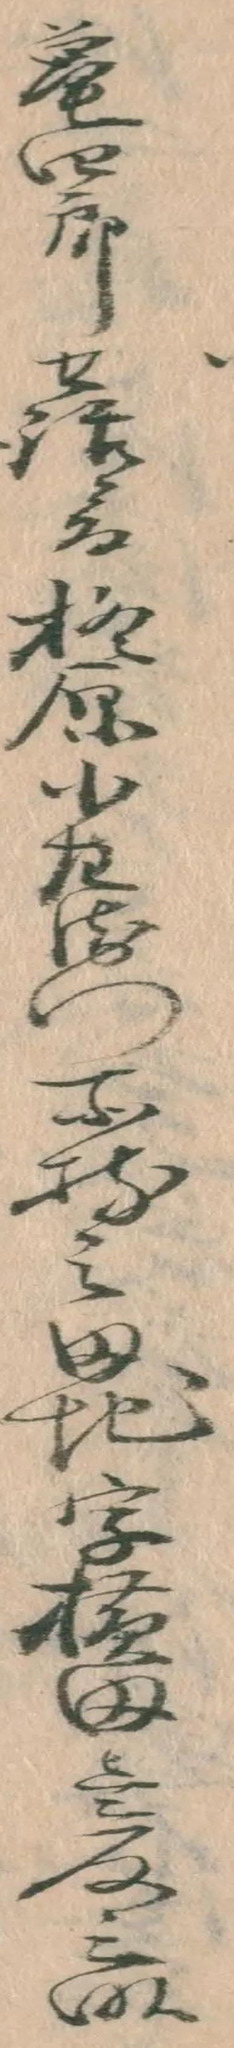亀四郎世話ニ而柊原小左衛門所持之田地字横田壱反三畝
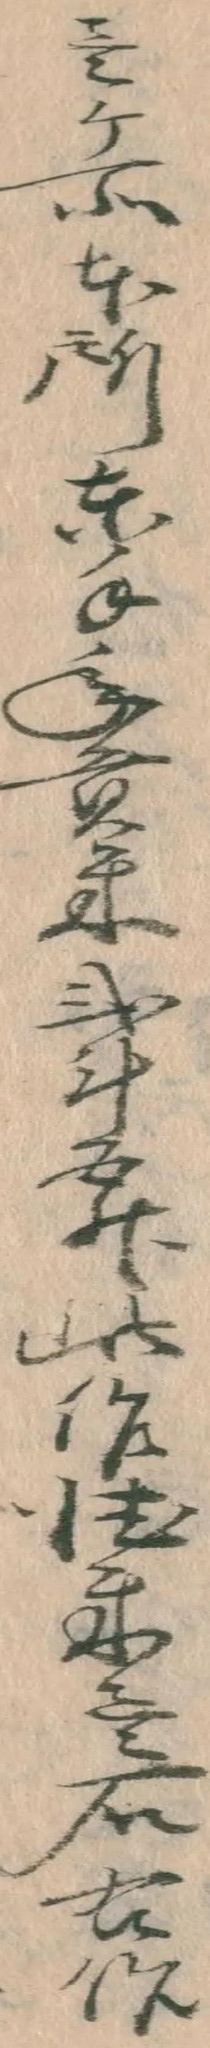壱ヶ所本所東手年貢米弐斗五升此作徳米壱石右作
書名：賀茂社記録. 第66冊
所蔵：国立国会図書館 National Diet Library, JAPAN
